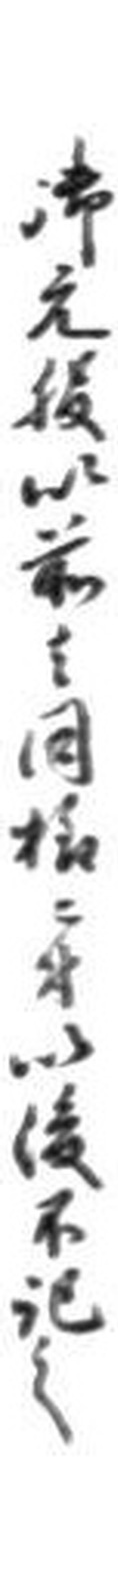御元服以前者同様ニ付以後不記之
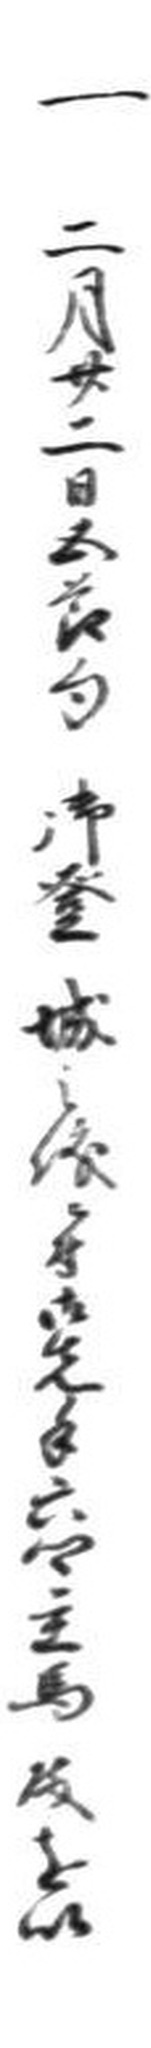一、二月廿二日五節句御登城之儀ニ付御先手六郷主馬殿を以
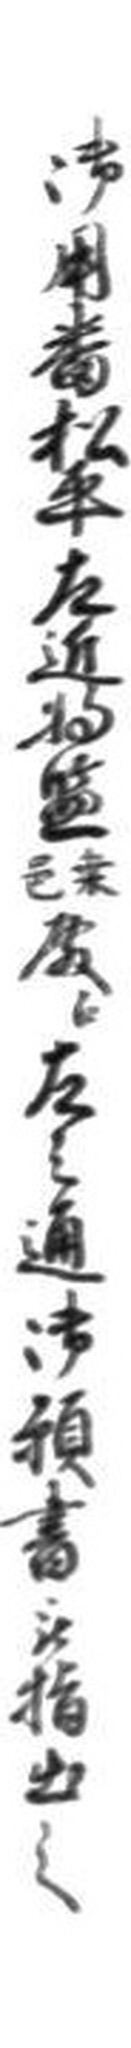御用番松平左近将監乗邑殿江左之通御願書被指出之
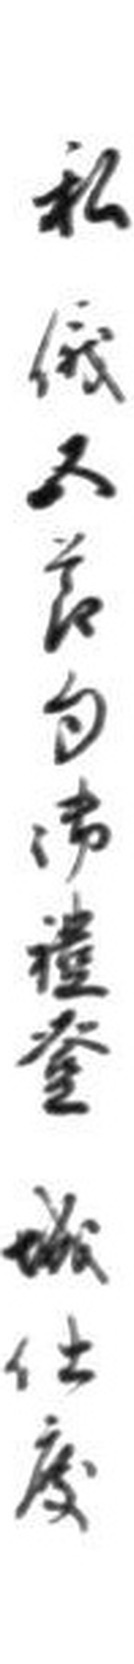私儀五節句御礼登城仕度
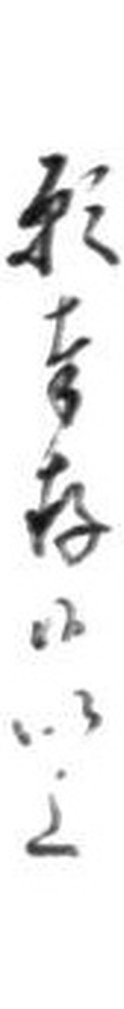願奉存候以上

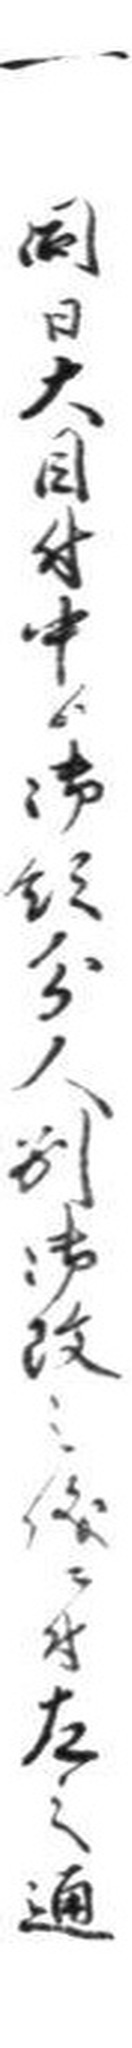一、同日大目付中ゟ御領分人別御改之儀ニ付左之通
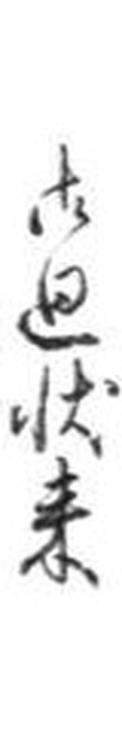御廻状来
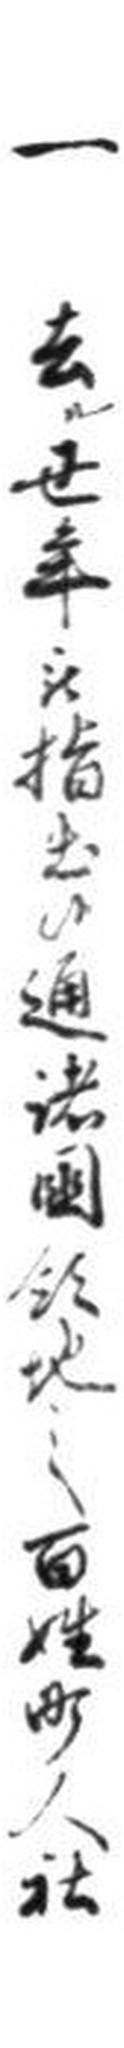一、去ル丑年被指出候通諸国領地之百姓町人社
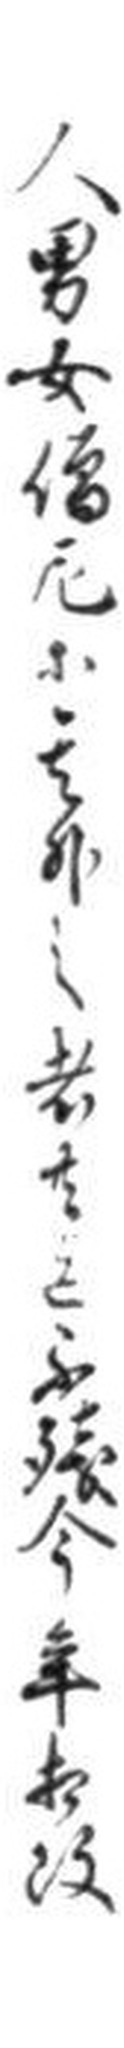人男女僧尼等其外之者共迄不残今年相改
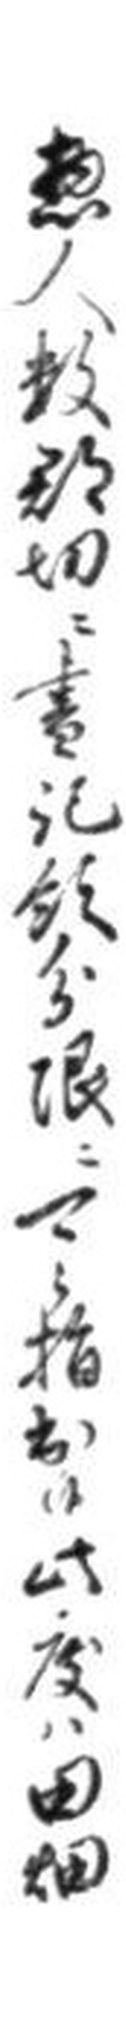壮惣人数郡切ニ書記領分限ニ可被指出候此度ハ田畑
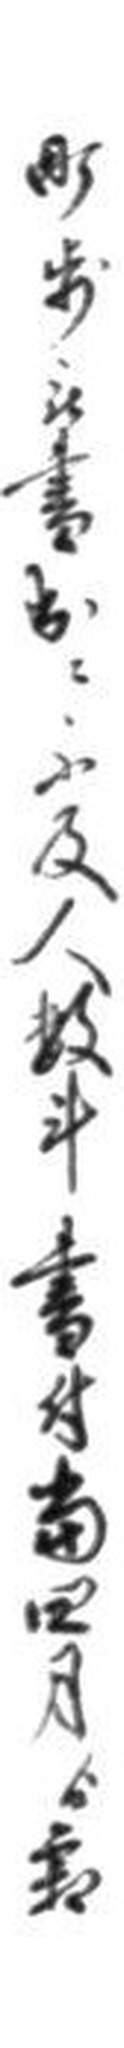町歩被書出ニ不及人数斗書付当四月ゟ霜
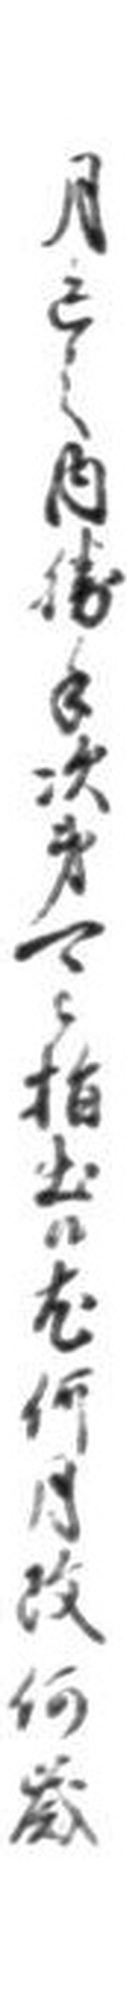月迄之内勝手次第可被指出候尤何月改何歳
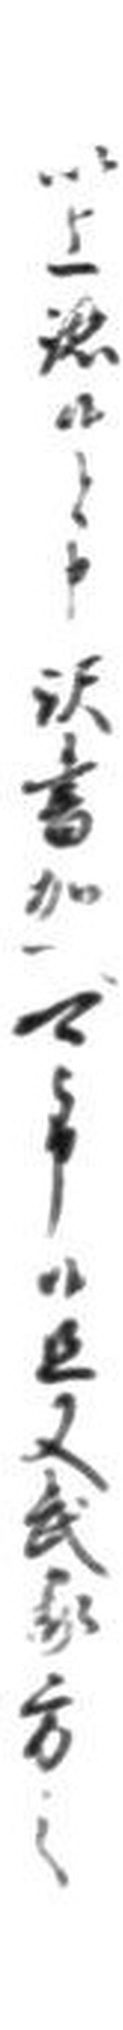以上認候と申訳加へ可被申候且又武家方之
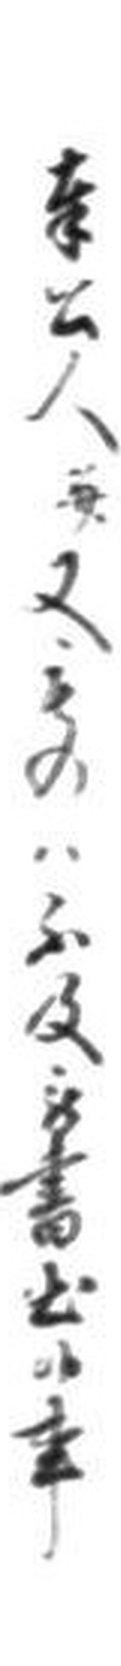奉公人并又ものハ不及被書出候事
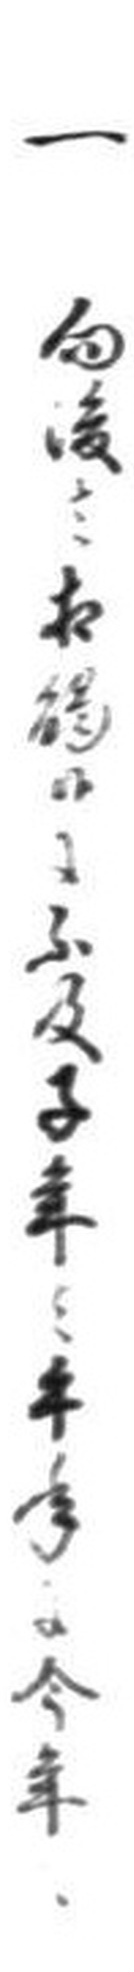一、向後者相触候に不及子年与午年に今年
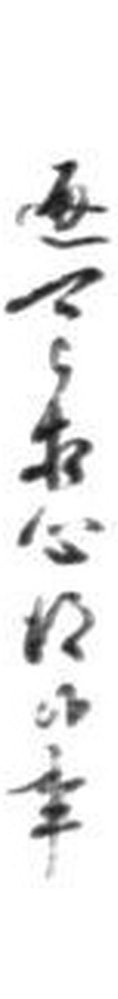通可被相心得候事
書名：家譜 四十 宗矩公 従享保十一年到享保十二年
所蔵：福井県文書館 Fukui Prefectural Archives
